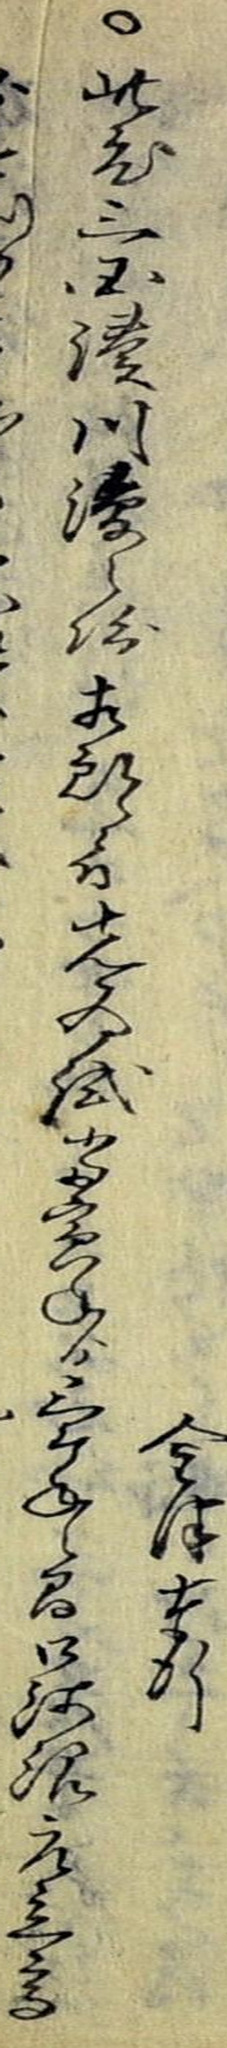○此度三国湊川浚之儀相願候に付先為試當寅年ゟ三ヶ年之間口銭銀取立高
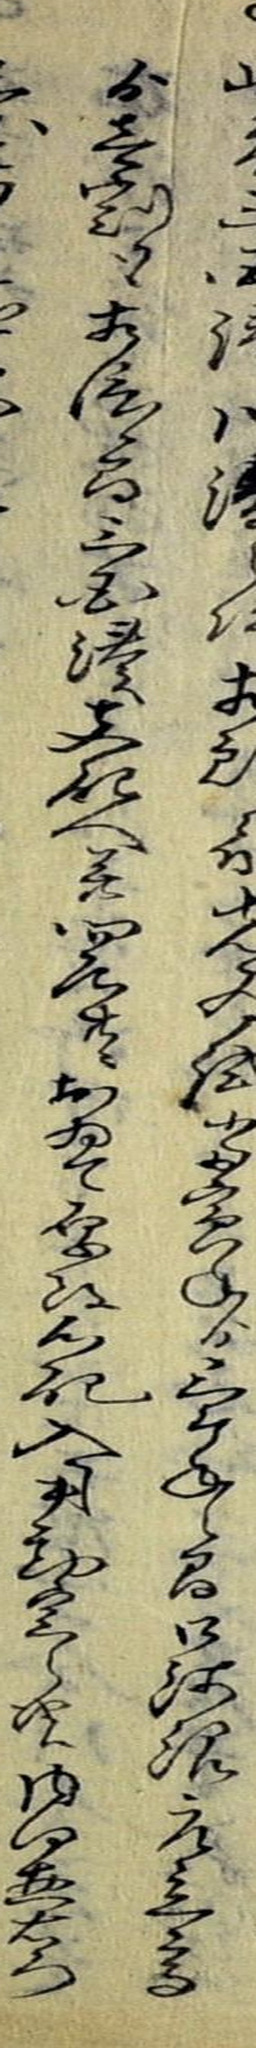ゟ壱割つヽ相渡候間三国湊支配人并問屋共におゐて厚致心配入用勘定之儀は内田惣右衛門
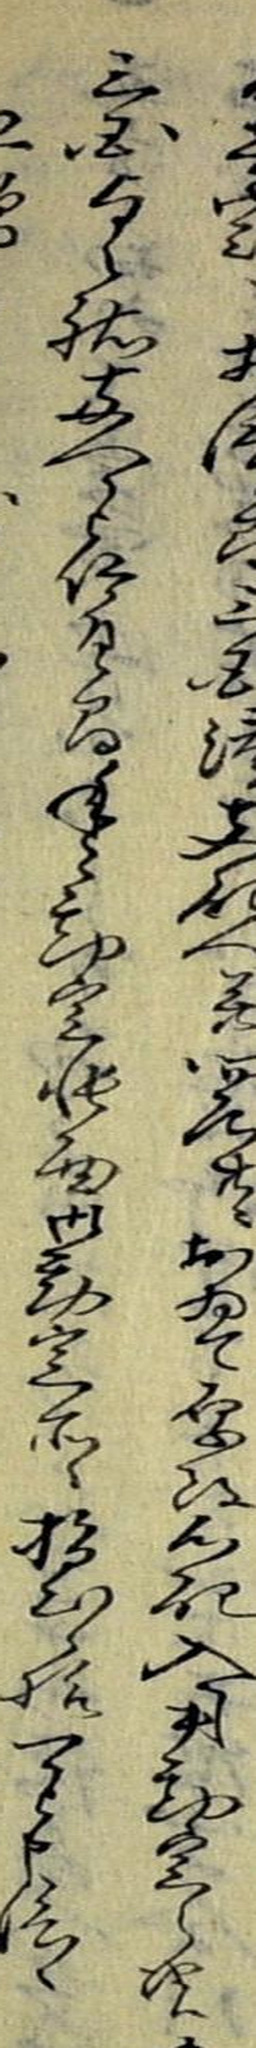三国与之祐両人へ被仰付候間年々勘定帳面御勘定所へ指出候様可被申渡候
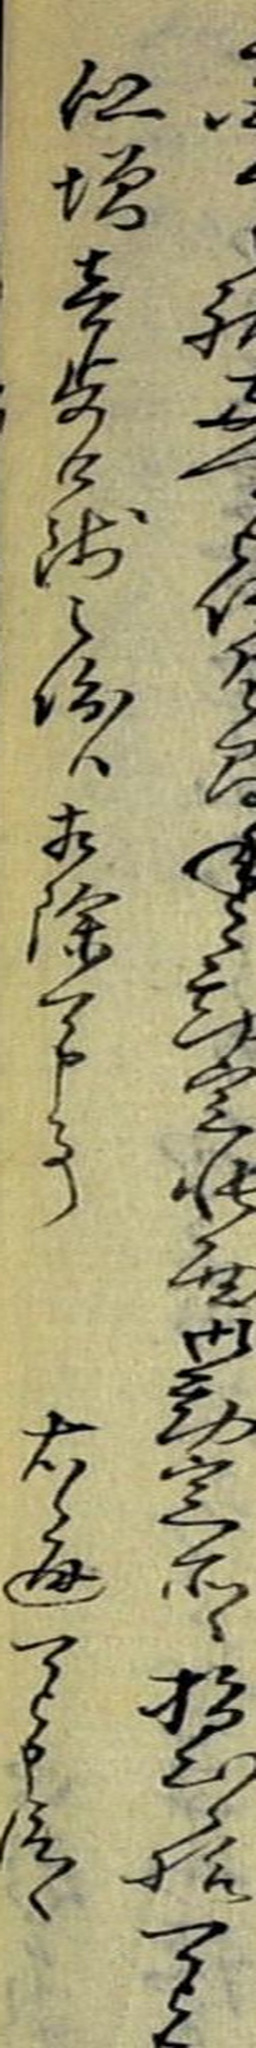但増壱歩口銭之儀は相除可申事右之通可被申渡候
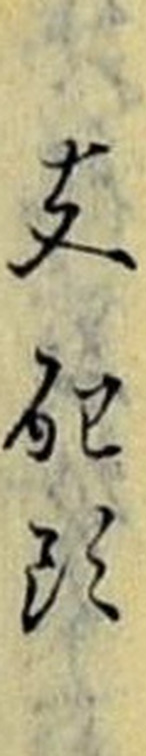支配頭
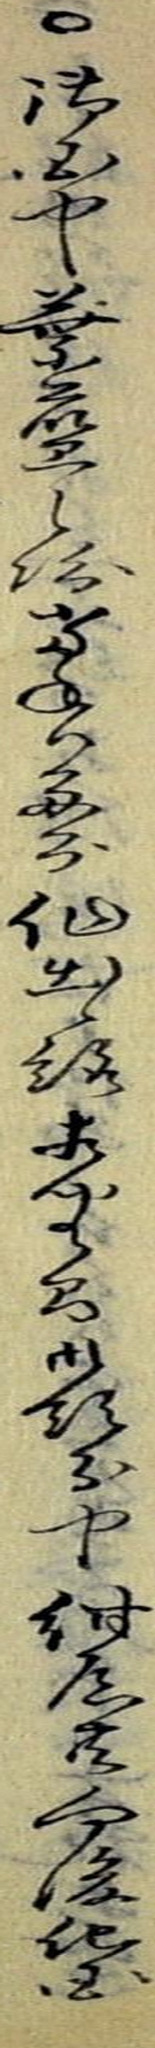○御国中葉藍之儀当年は多分徊出候趣相聞候間御領分中紺屋共向後他国
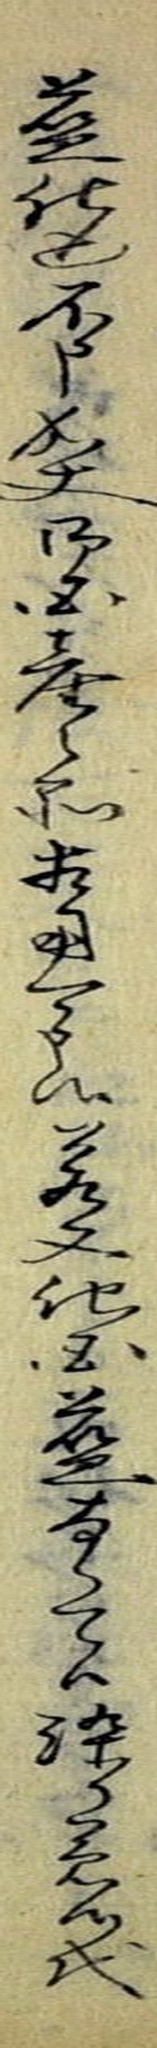藍仕込不申成丈御国産之品相用可申候若又他国藍ならては染り兼候代
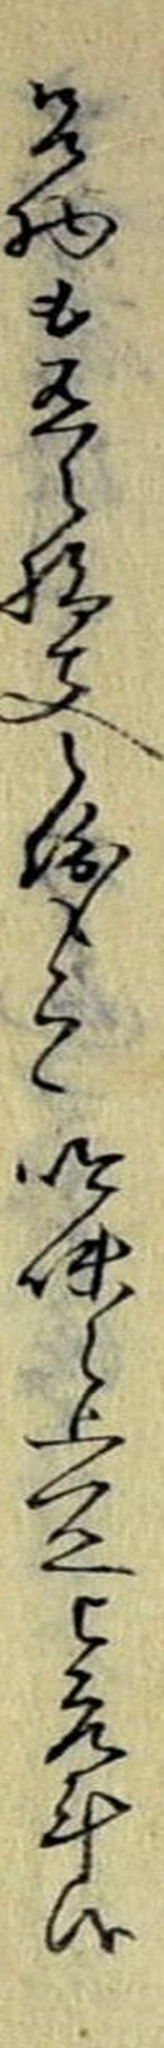召物も有之指支之儀に候はヽ吟味之上宜取斗候
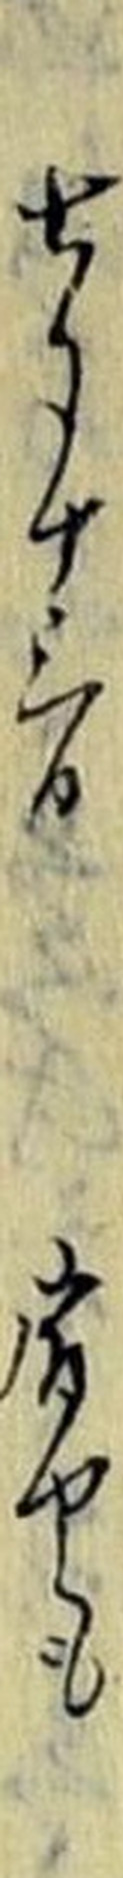七月十三日府中へも
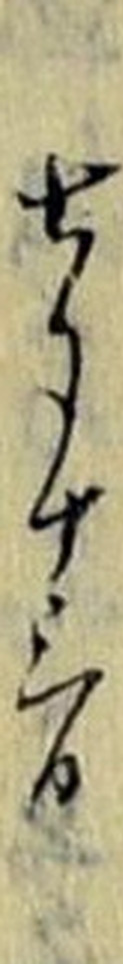六月十六日
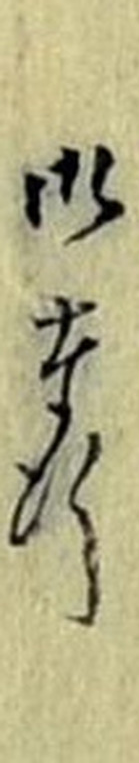御奉行
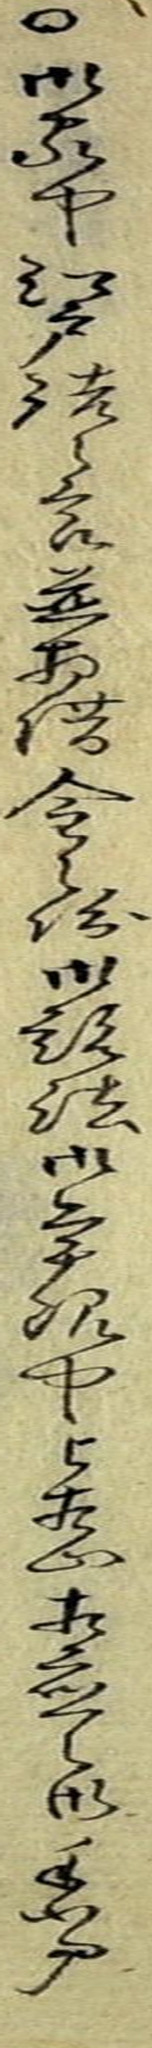○御家中江戸詰之節並拝借金之儀御趣法御年限中被相止相応之御手当
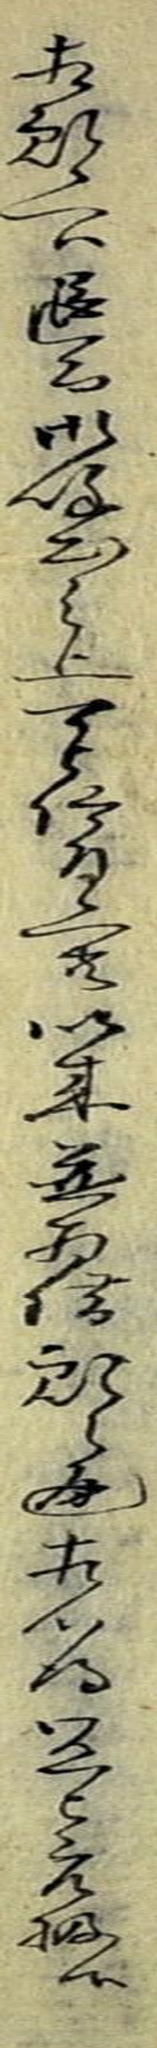相願候へは追而御呼出之上可被仰付候へ共以来並拝借願之通相心得宜被取扱候
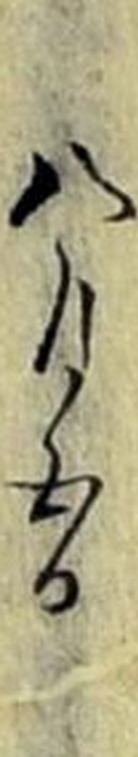八月五日
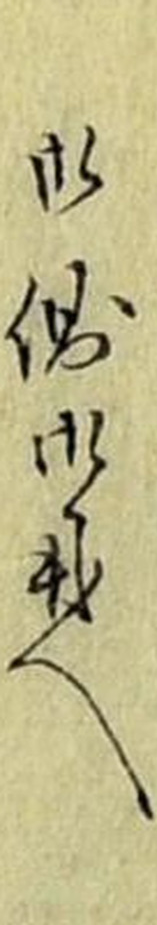御側御用人
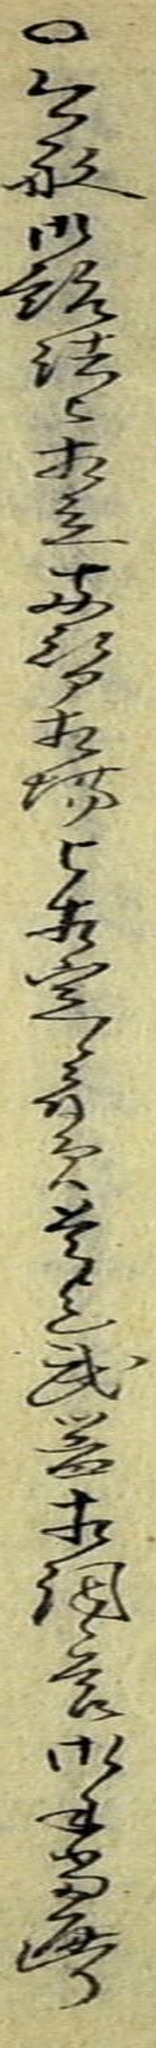○今般御趣法被相立両替相場被相定候に付而は是迄武器相調候節御手当通り
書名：命令之部 六
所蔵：福井県文書館 Fukui Prefectural Archives
